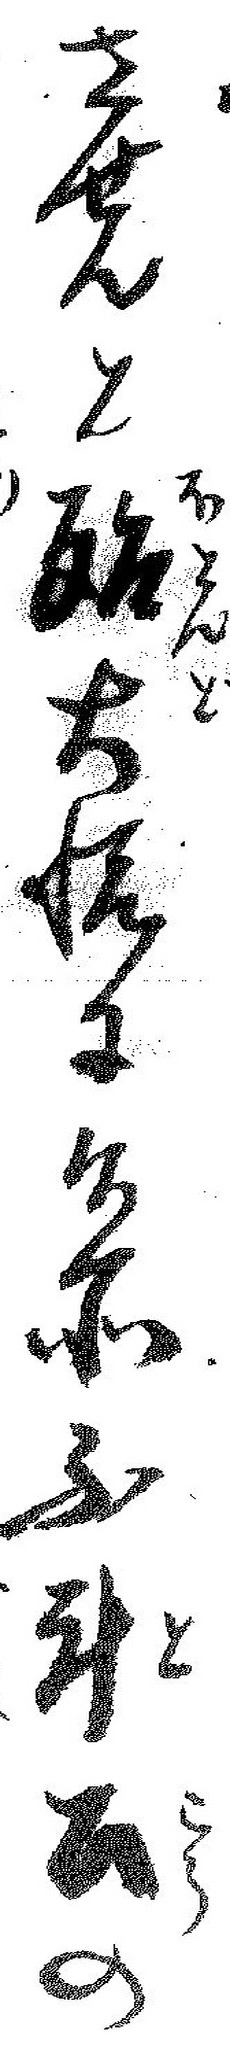させんと殆大悦に候所不斗公の
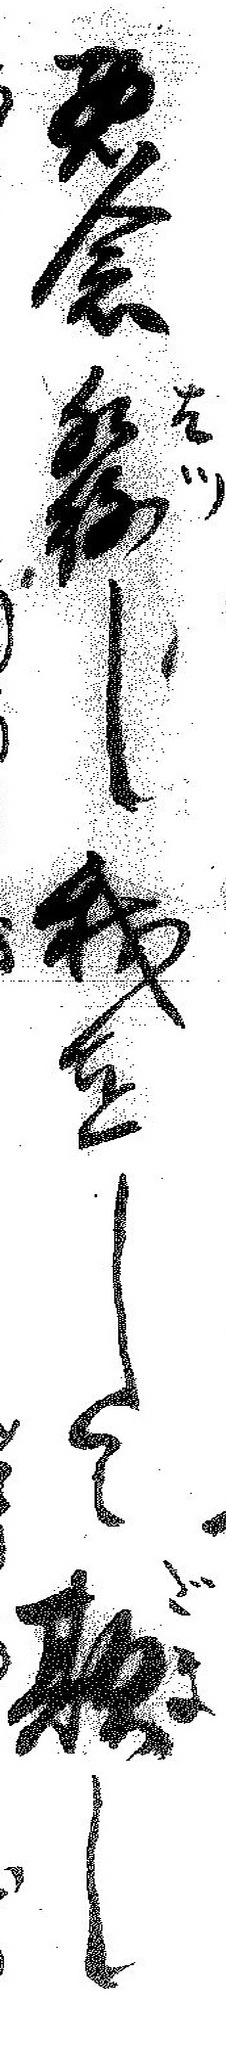悪念発し我をして欺し
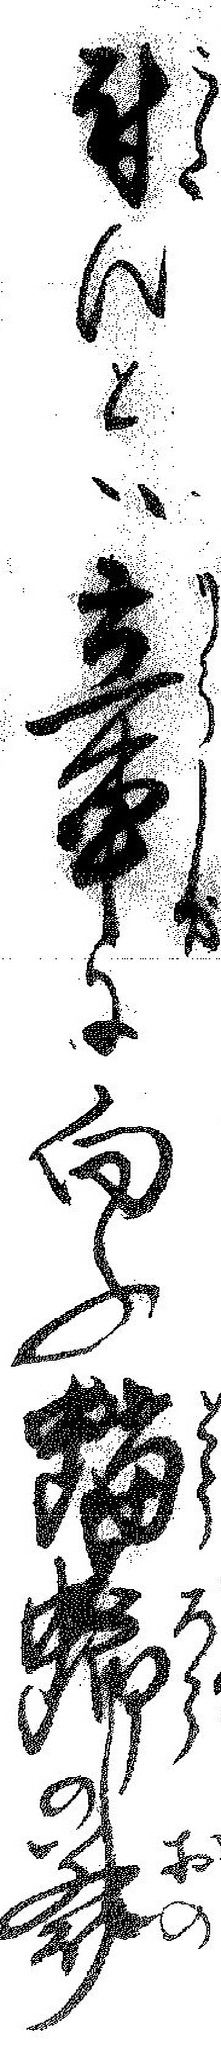討んとは立車に向ふ蟷螂の斧
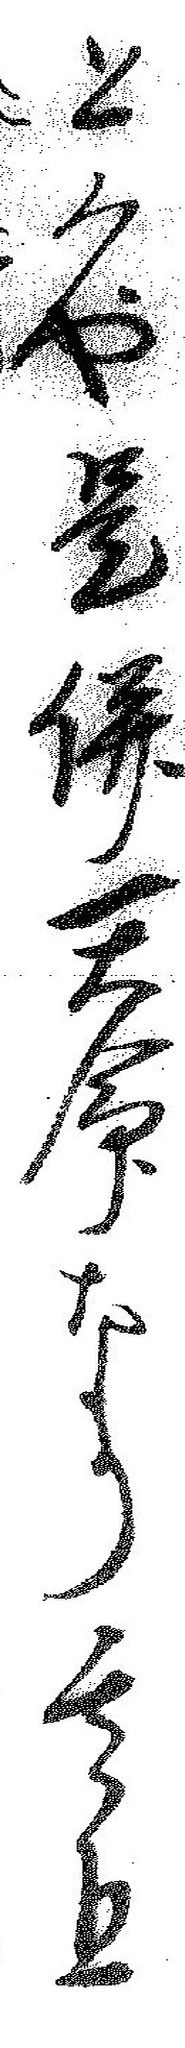とかや是併天命なり其上
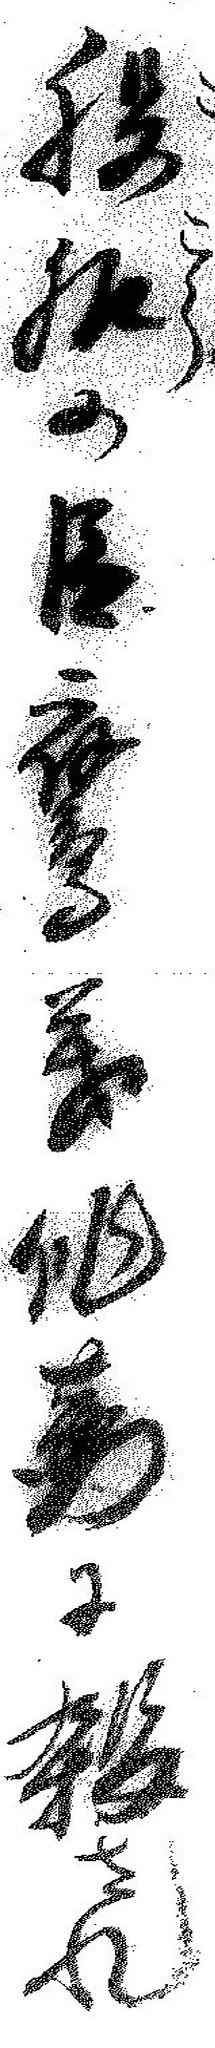股肱の臣鷹義作右衛門に殺され
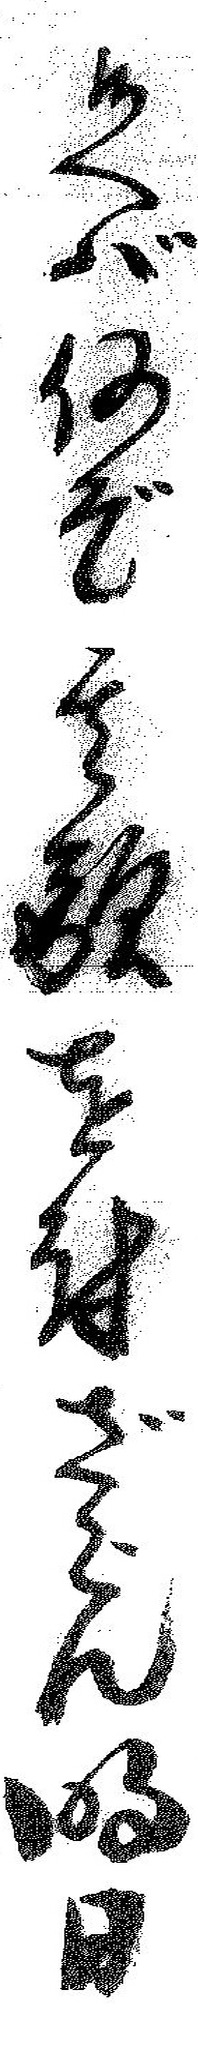候へば何ぞ其敵を討ざらん明日
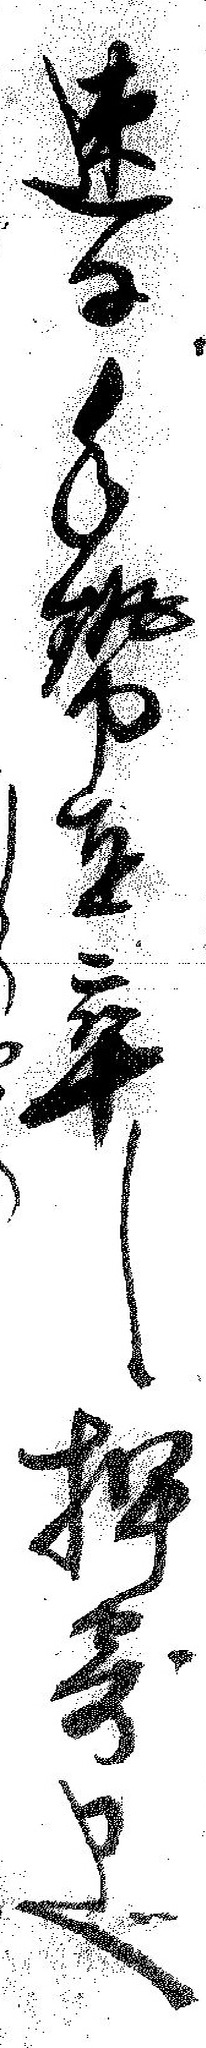速に手勢を率し押寄申べ
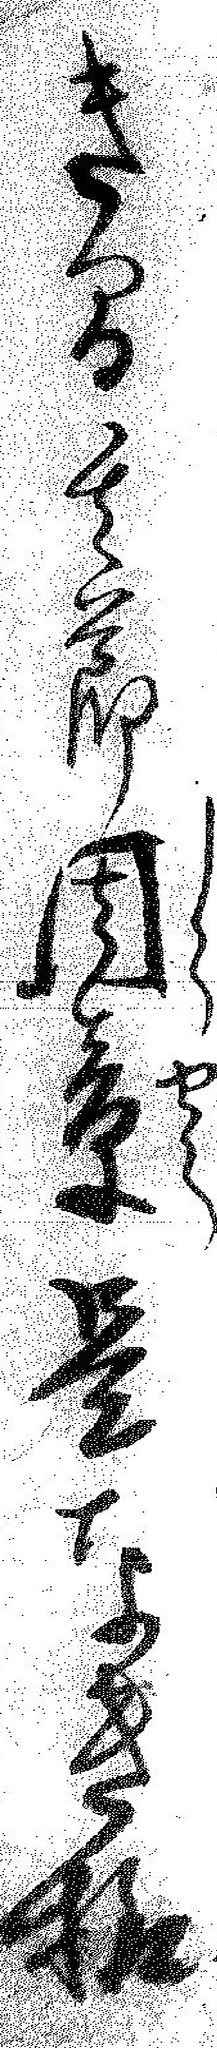き間其節周章是なき様

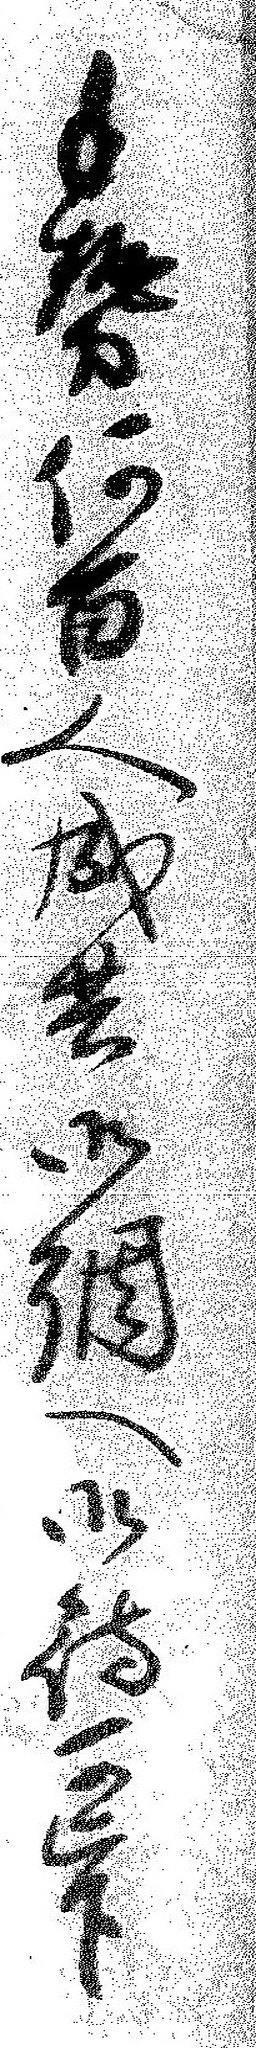手勢何百人成共御調へ御待可被下
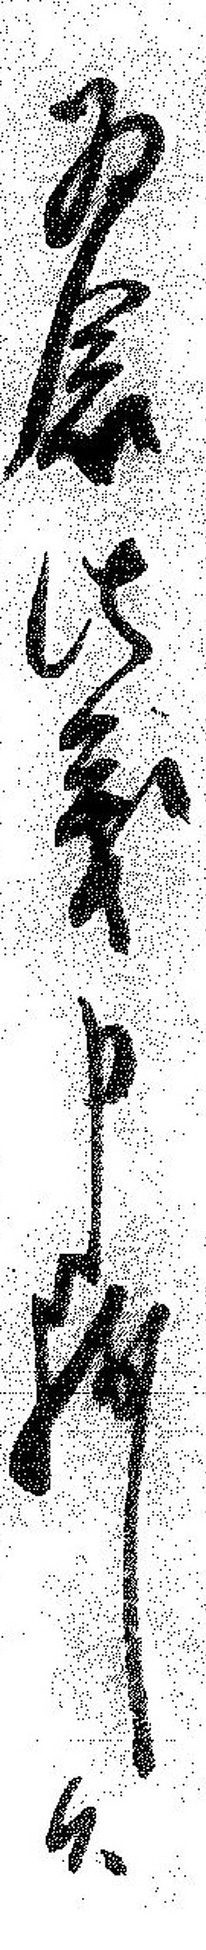為念此義申残し候
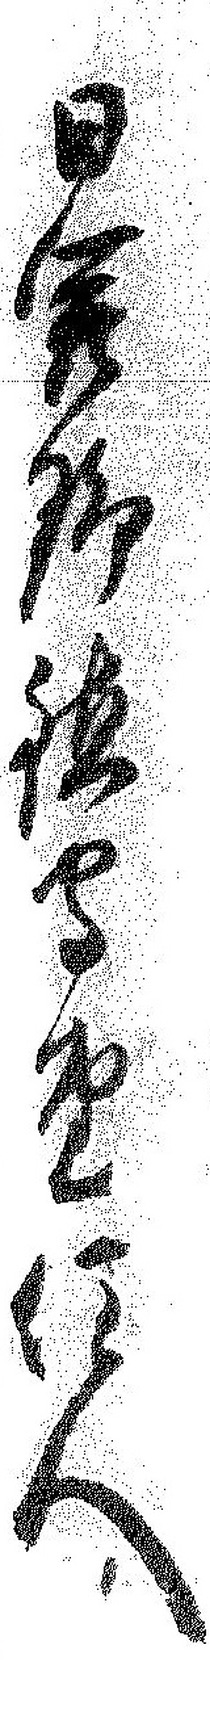日開野鎮守堂住人
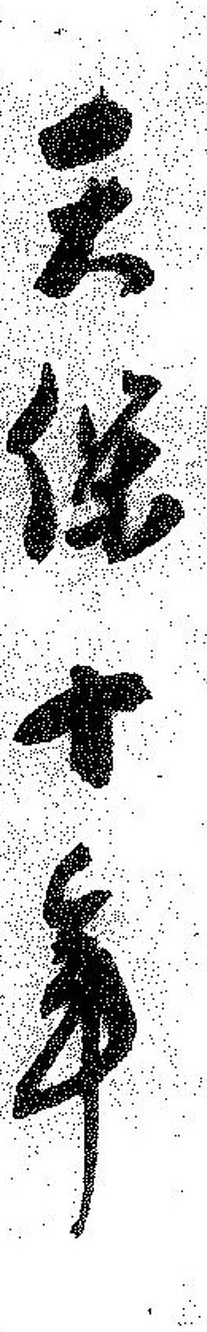天保十年
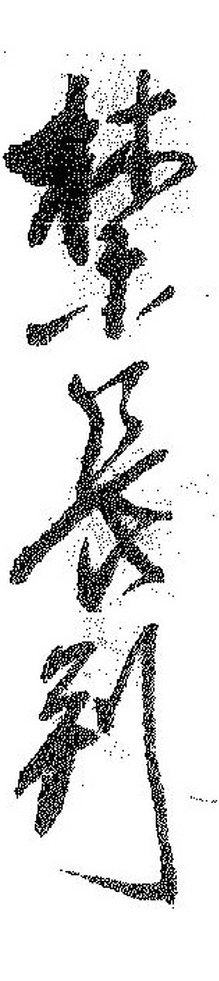禁長判
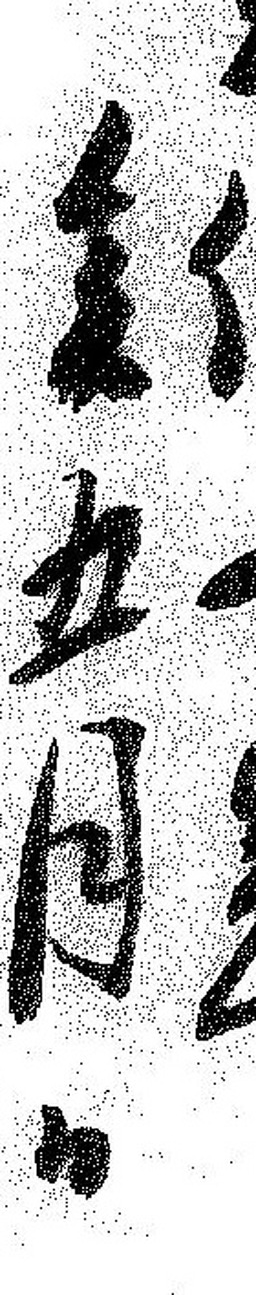亥五月日
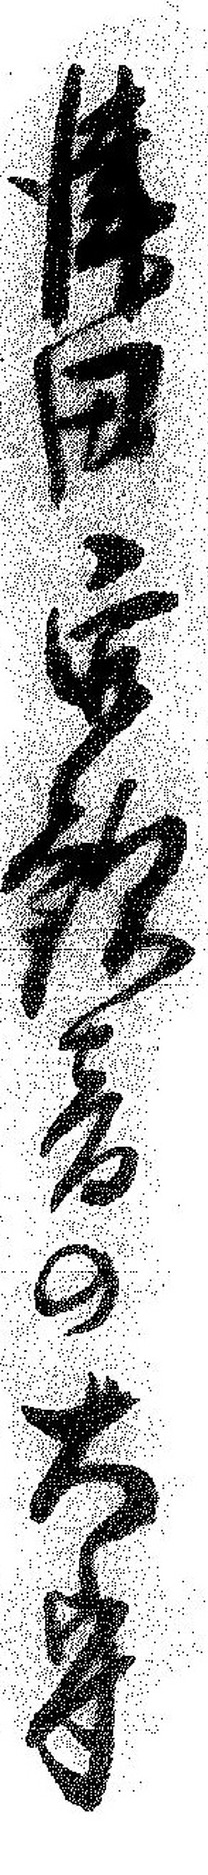津田穴観音の太守
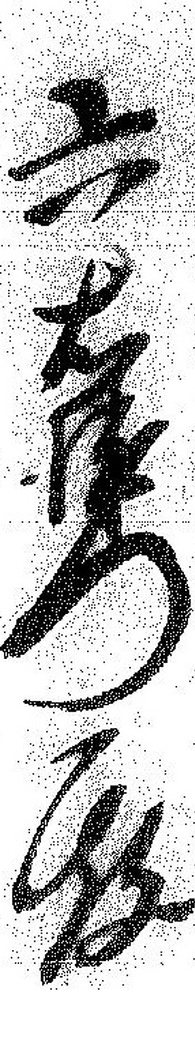六右衛門殿
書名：近頃古狸珍説　礼義智信
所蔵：徳島県立図書館
